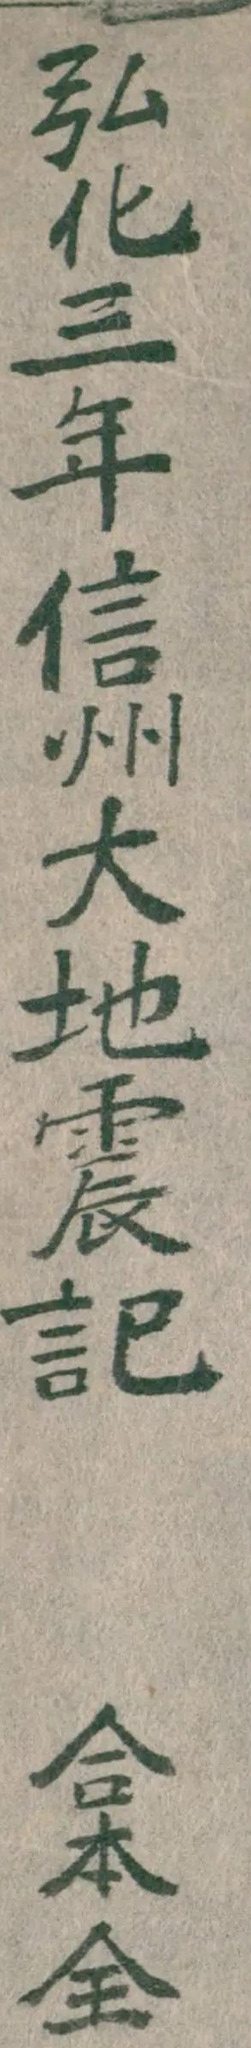弘化三年信州大地震記合本全

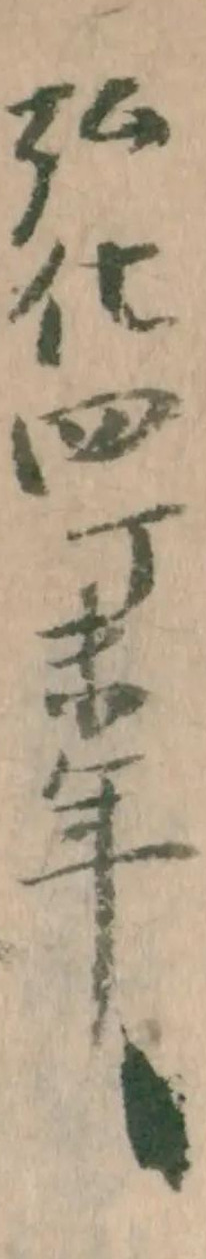弘化四丁未年

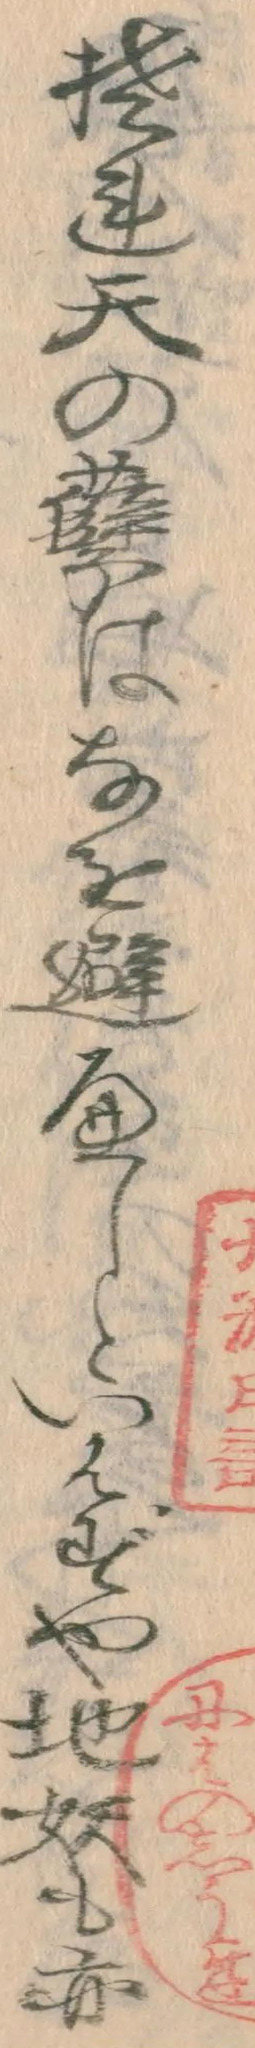それ天の蘖はなを避へしといはすや地妖も亦
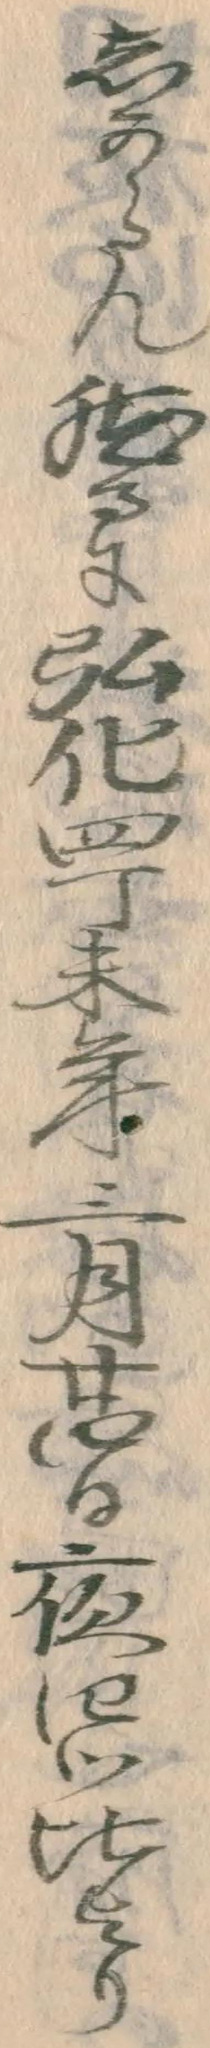しからん然に弘化四丁未年三月廿四日夜四ッ比より
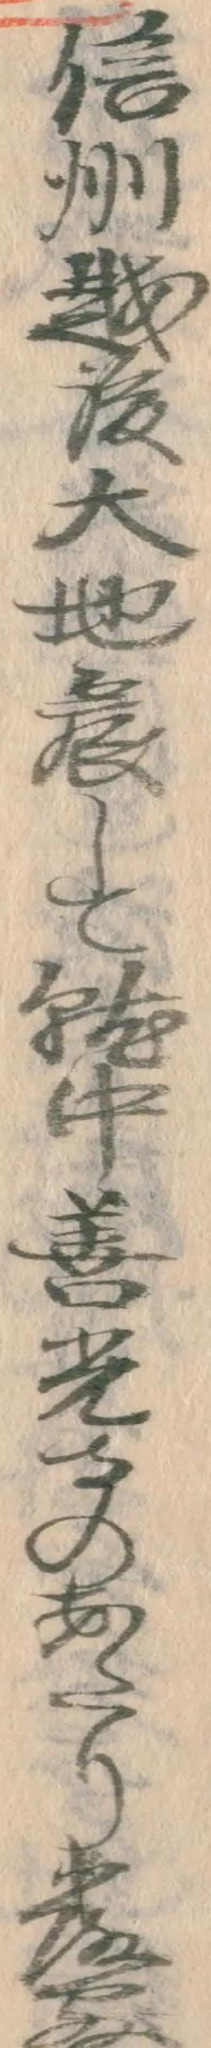信州越後大地震して就中善光寺のあたり厳敷
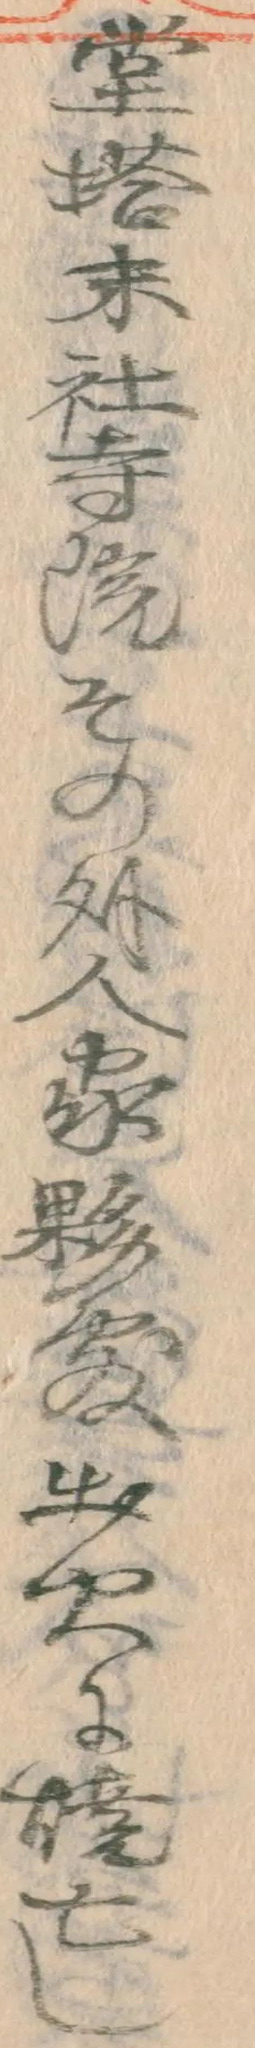堂塔末社寺院その外人家夥敷出火に焼亡し
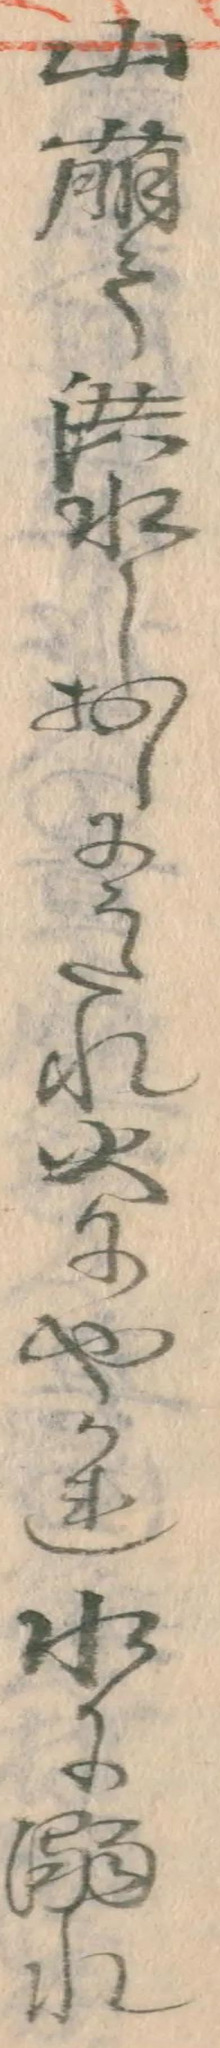山崩て洪水しおしにうたれ火にやかれ水に溺れ
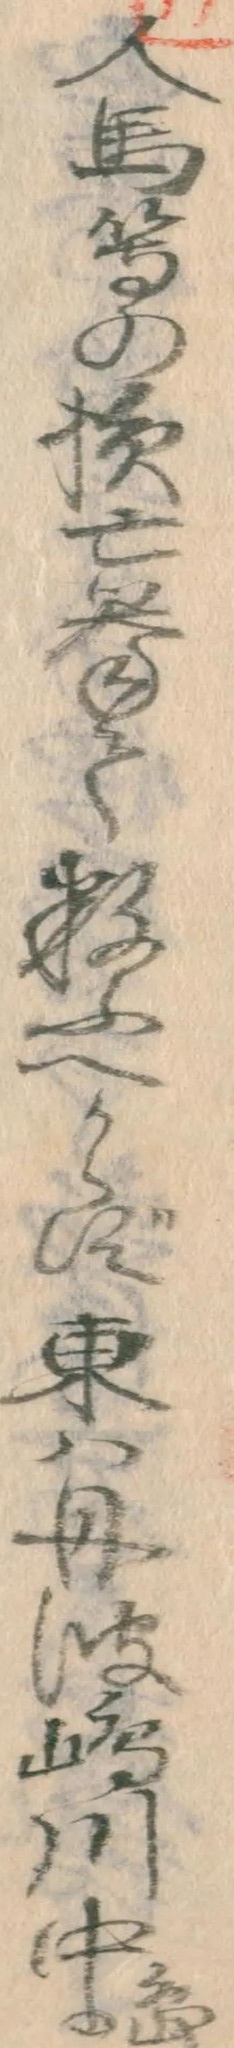人馬等の損亡挙て数ふへからず東ハ丹波島川中島
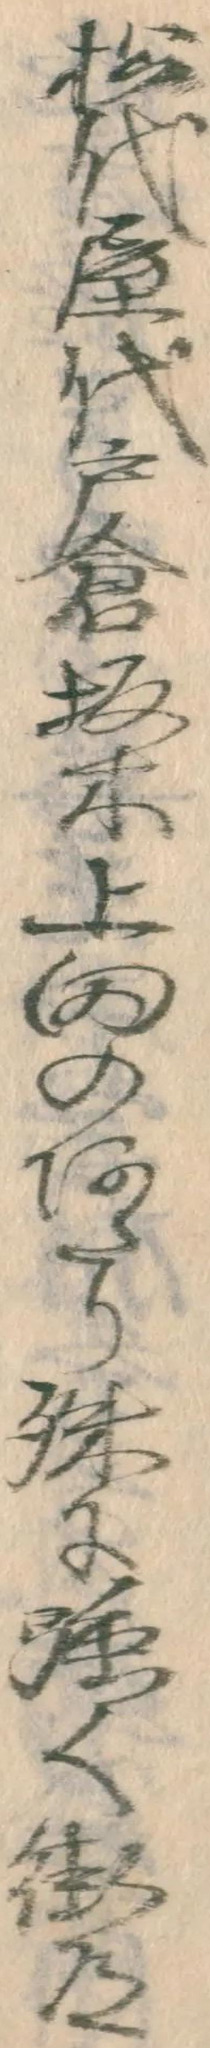松代屋代戸倉坂木上田のあたり殊に強く街道
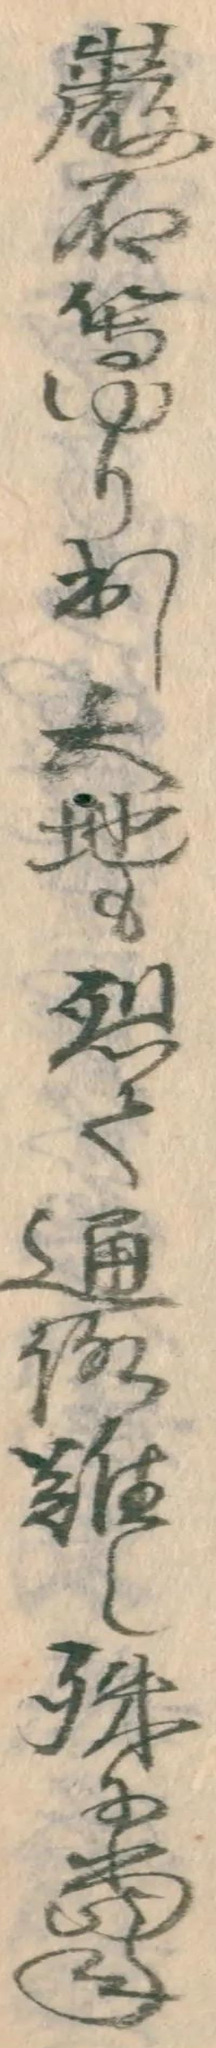巖石等ゆり出し大地も裂て通路難し殊に当年
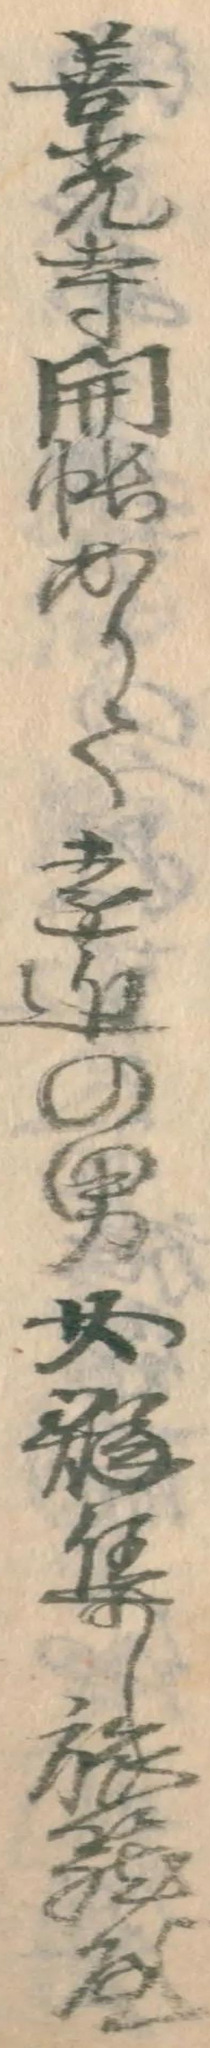善光寺開帳ありて遠近の男女群集し旅籠屋

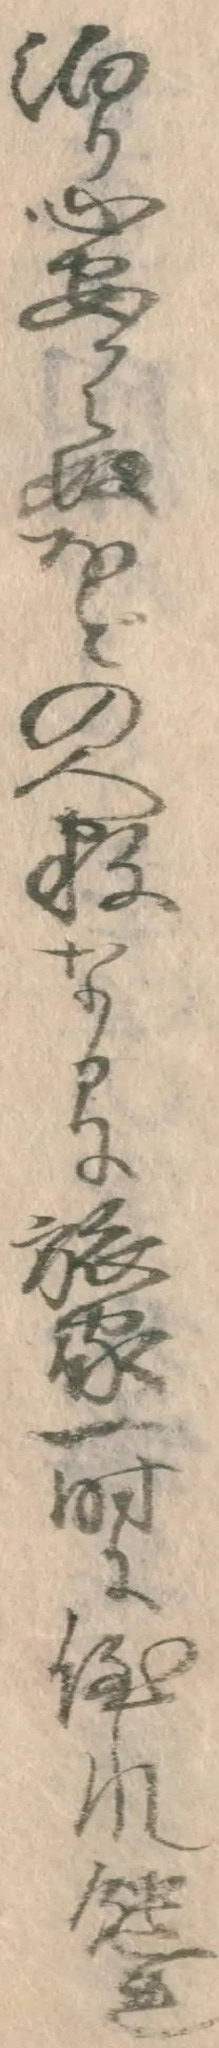泊心安からぬほとの人数なかに旅家一時に倒れ懸れ
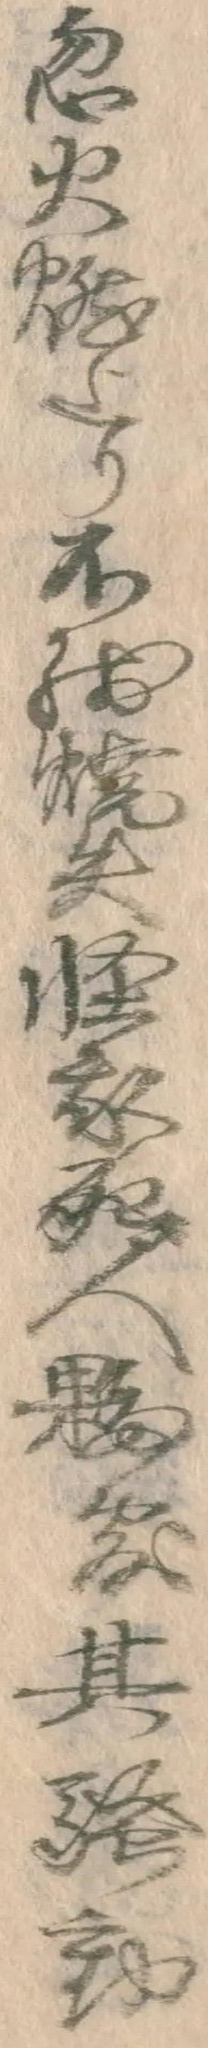忽火燃上り不残焼失怪我人夥敷其騒動
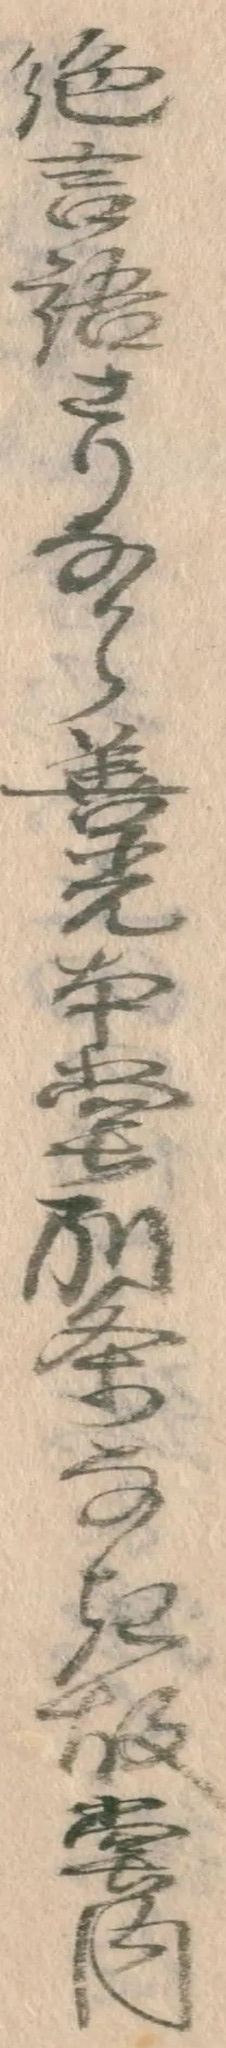絶言語さりなから善光寺本堂別条なき故堂内
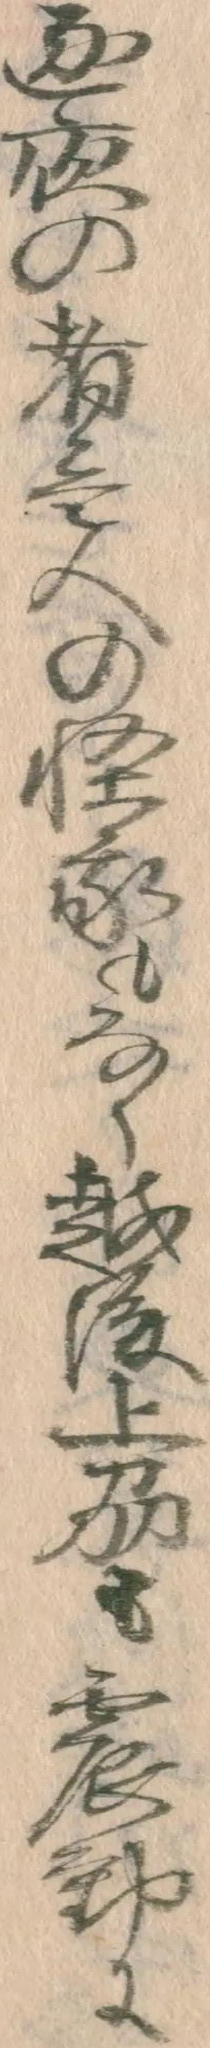通夜の者壱人の怪我もなく越後上州も震動に
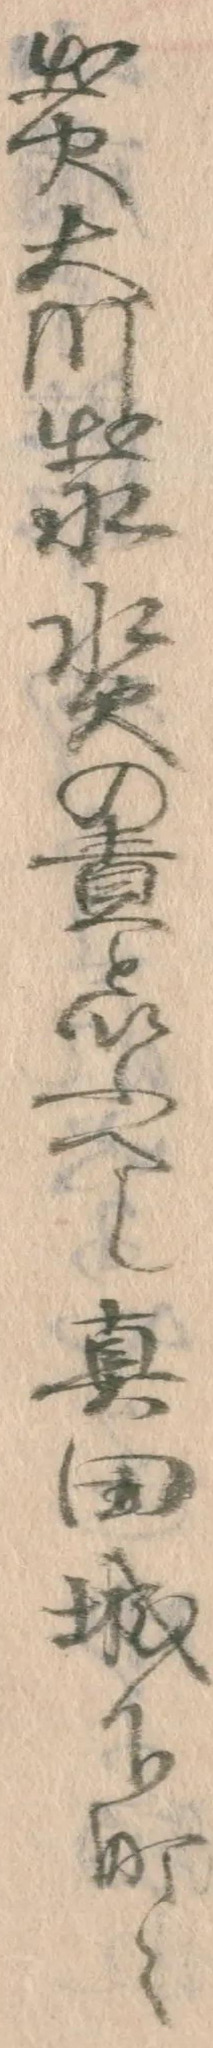出火大川出水水火の責といふへし真田城下町之
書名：信州大地震之記
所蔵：国立国会図書館 National Diet Library, JAPAN
